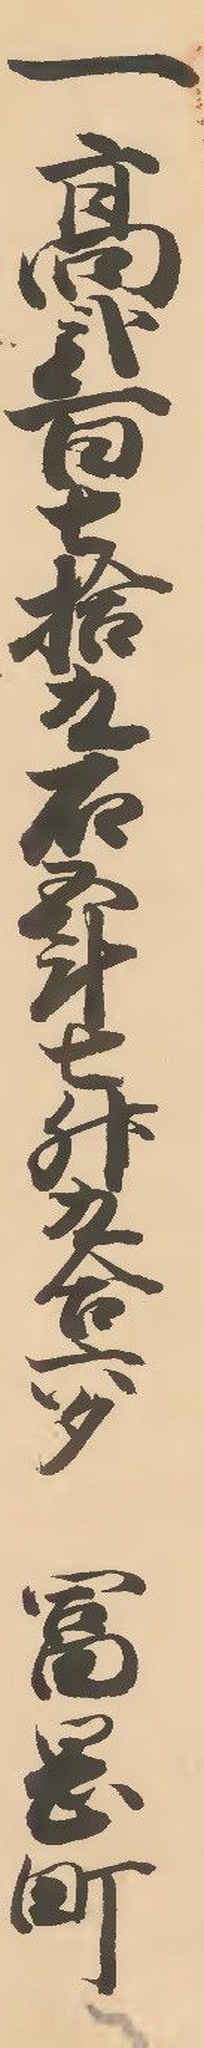一髙弐百七拾九石五斗七升九合六夕冨岡町

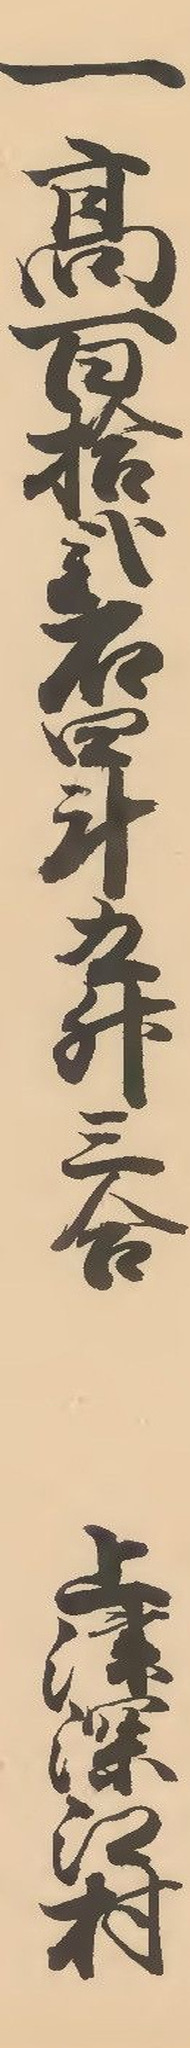一髙百拾弐石四斗九升三合上津深江村
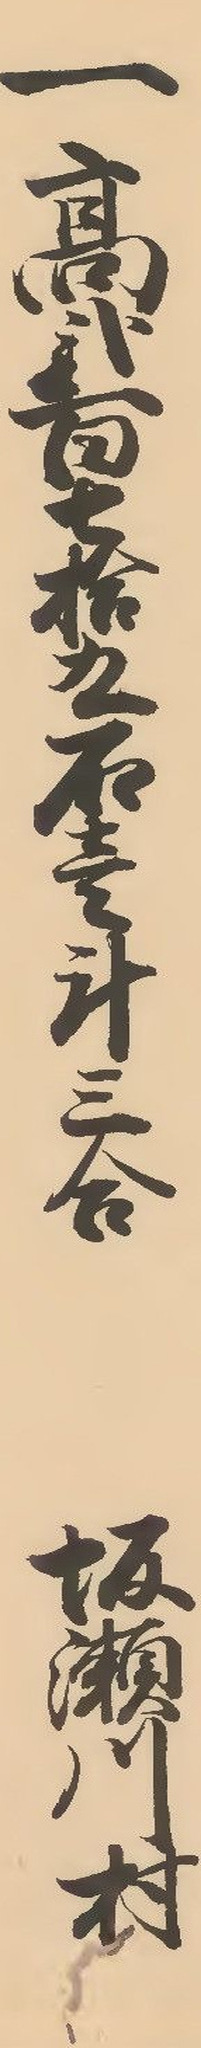一髙弐百七拾九石壱斗三合坂瀬川村
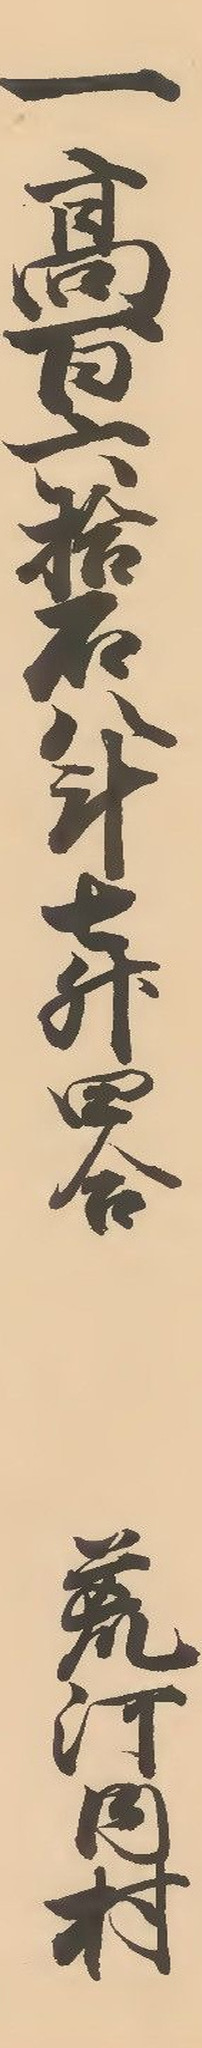一髙百六拾石八斗七升四合荒河内村
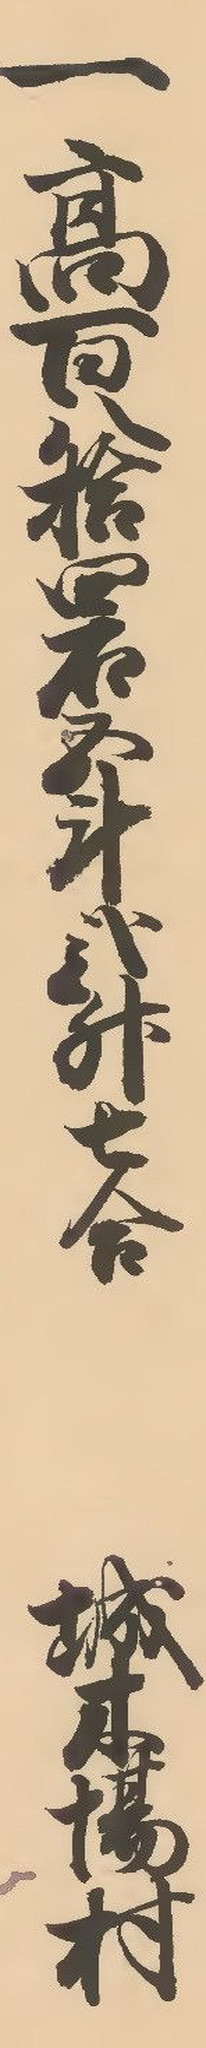一髙百八拾四石五斗弐升七合城木場村
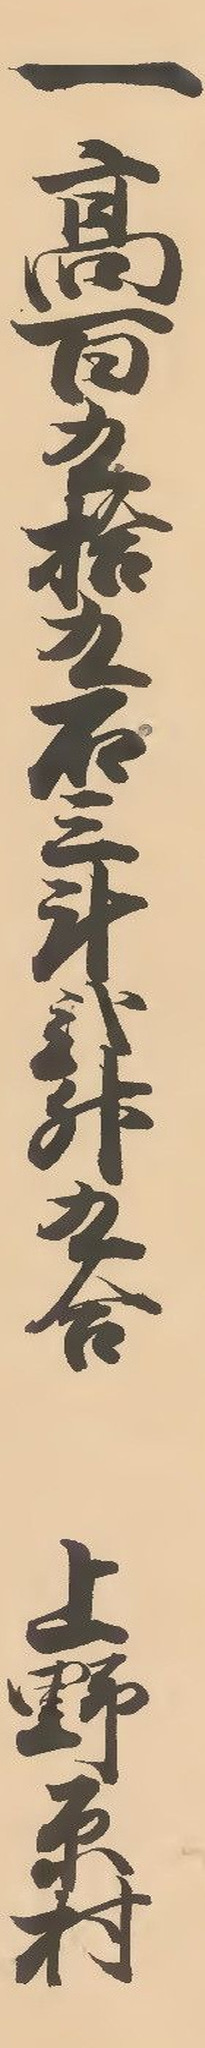一髙百九拾九石三斗弐升九合上野原村
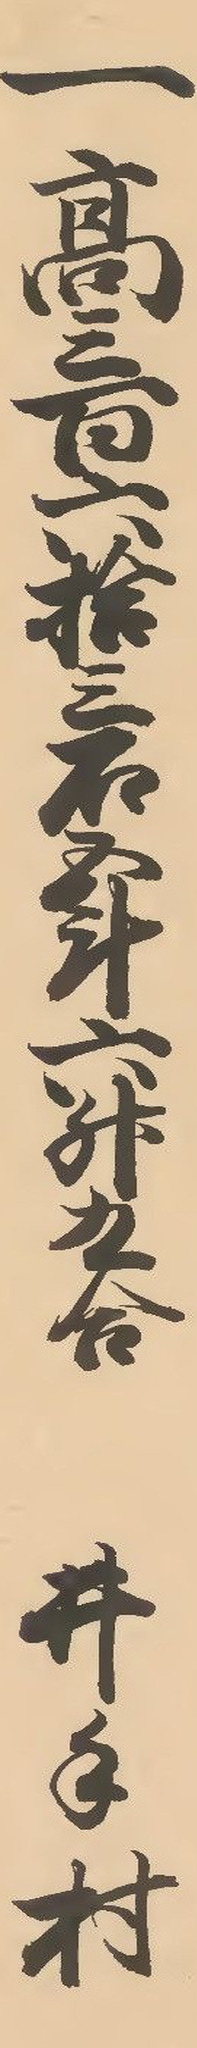一髙三百六拾三石五斗六升九合井手村
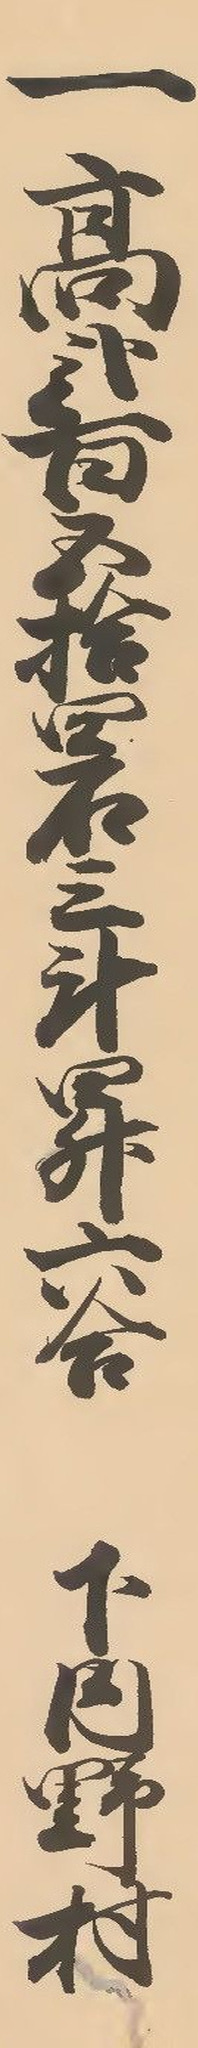一髙弐百五拾四石三斗四升六合下内野村
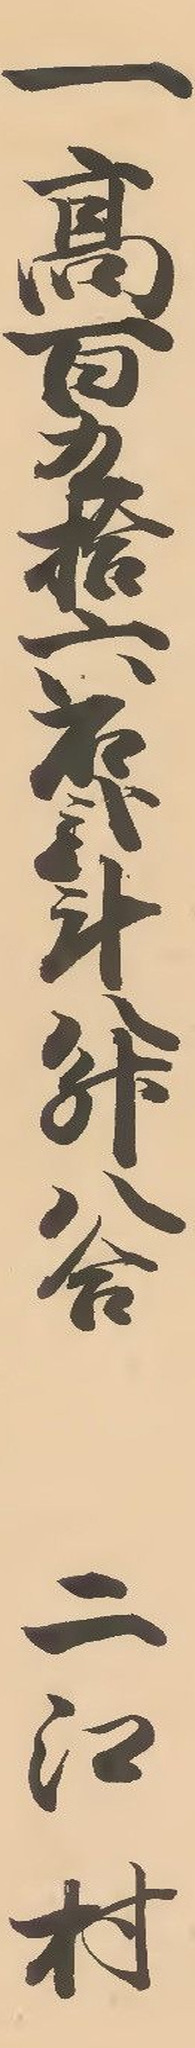一髙百九拾六石弐斗八升八合二江村

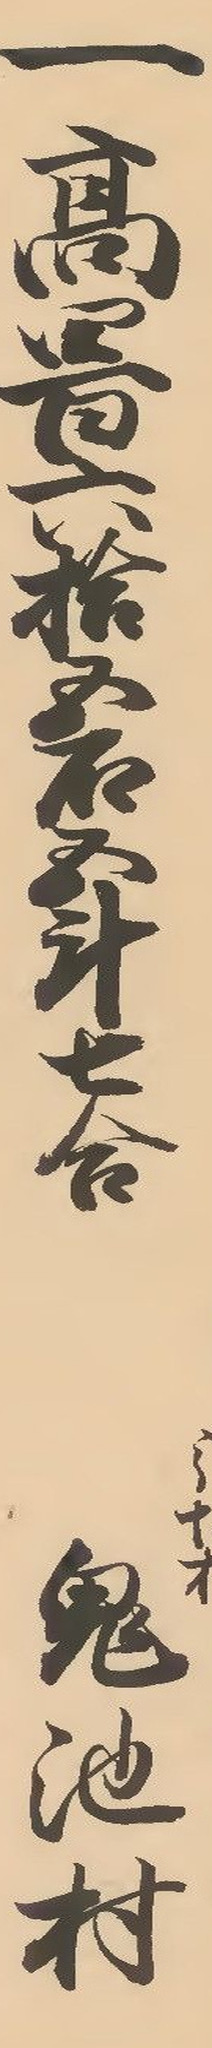一髙四百六拾五石五斗七合鬼池村
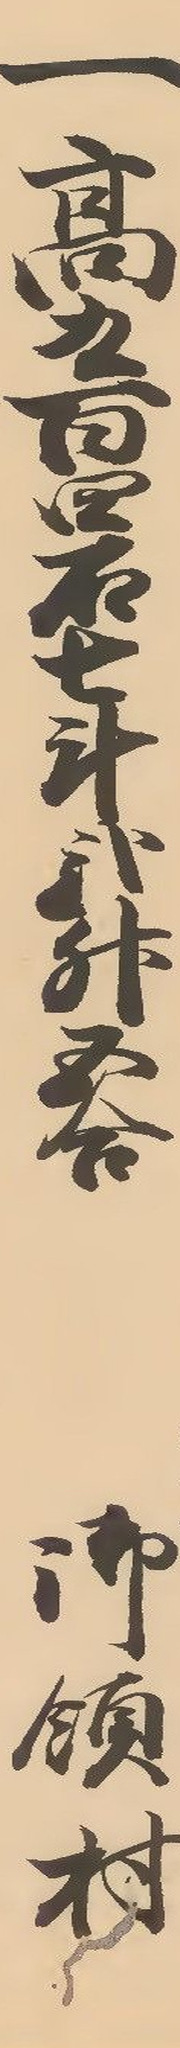一髙九百四石七斗弐升五合御領村
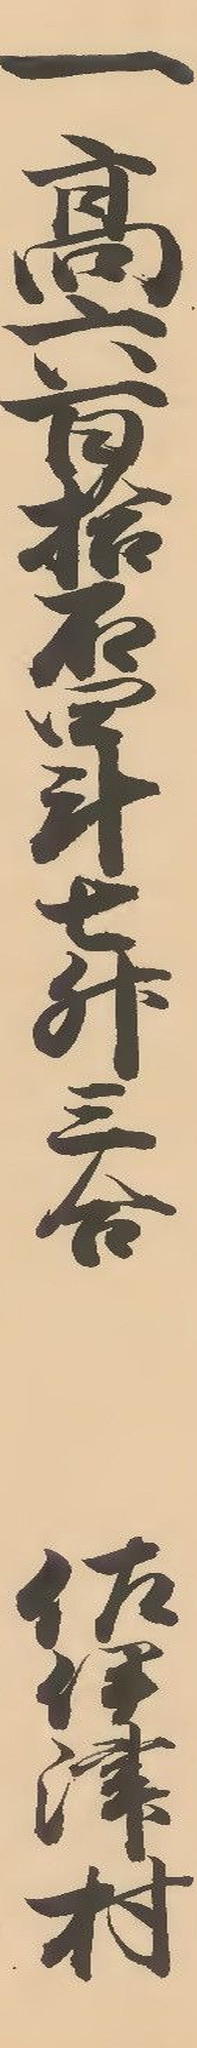一髙六百拾石四斗七升三合佐伊津村
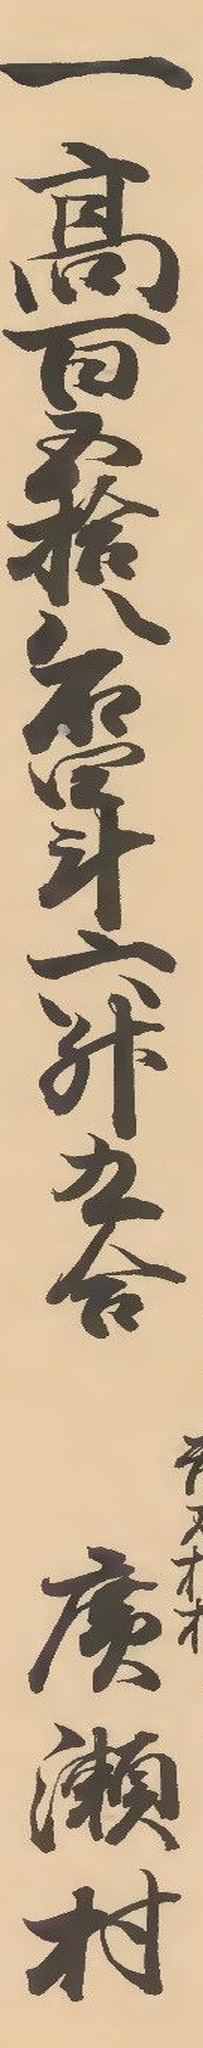一髙百五拾八石四斗六升九合廣瀬村
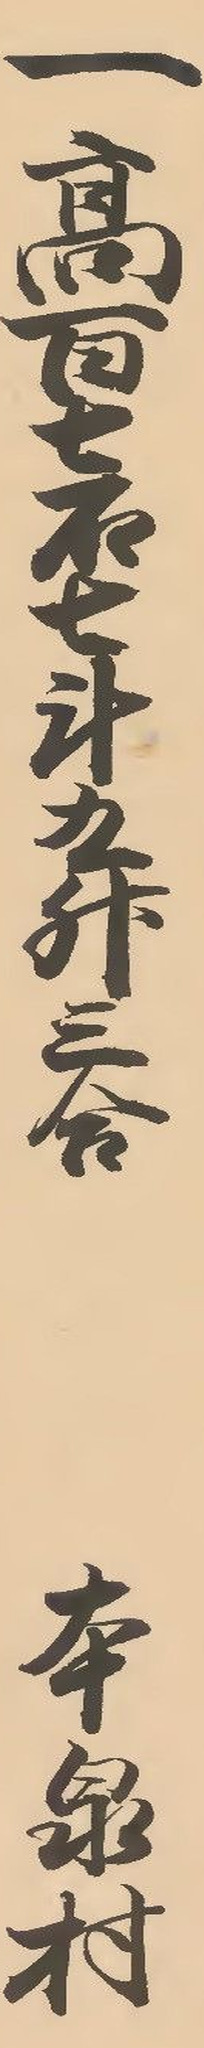一髙百七石七斗九升三合本泉村
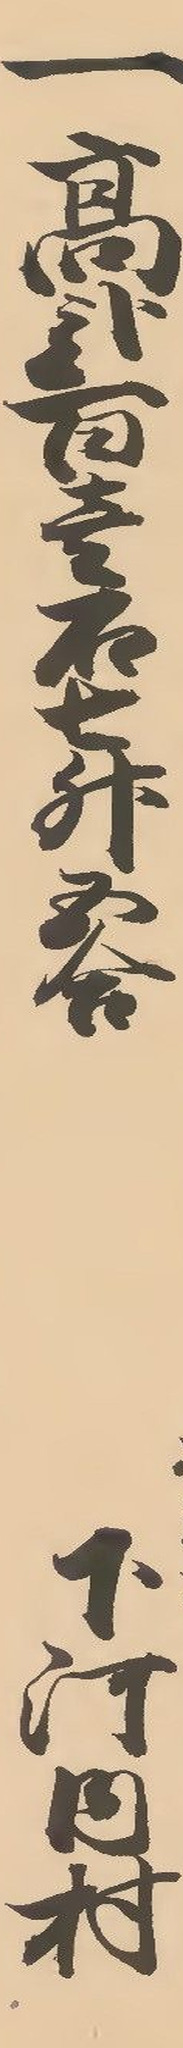一髙弐百壱石七升五合下河内村
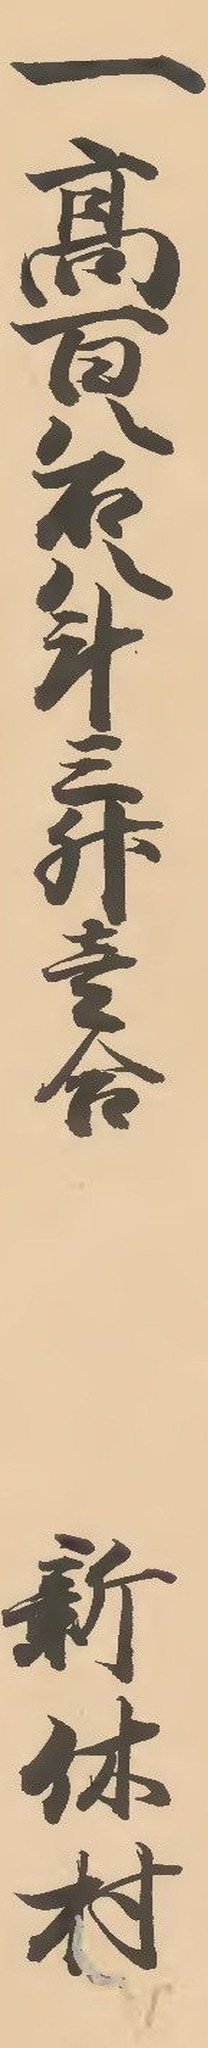一髙百八石八斗三升壱合新休村
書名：肥後国郷帳
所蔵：国立公文書館 National Archives of Japan
